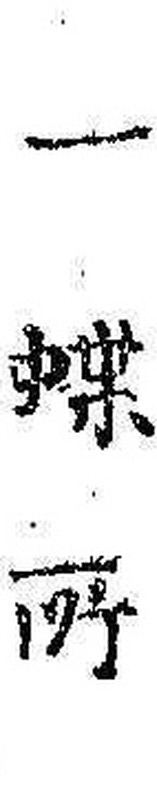一蝶所
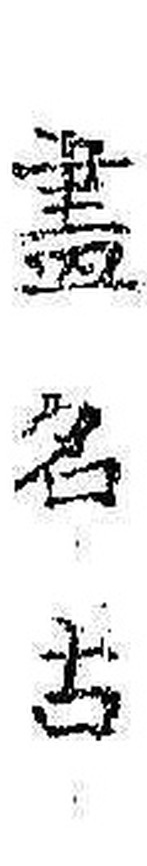画名古
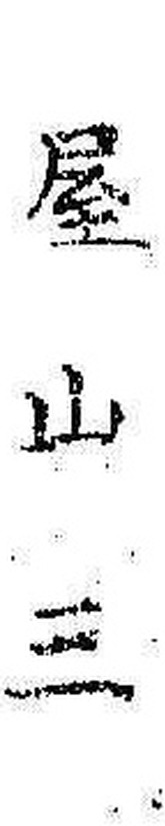屋山三

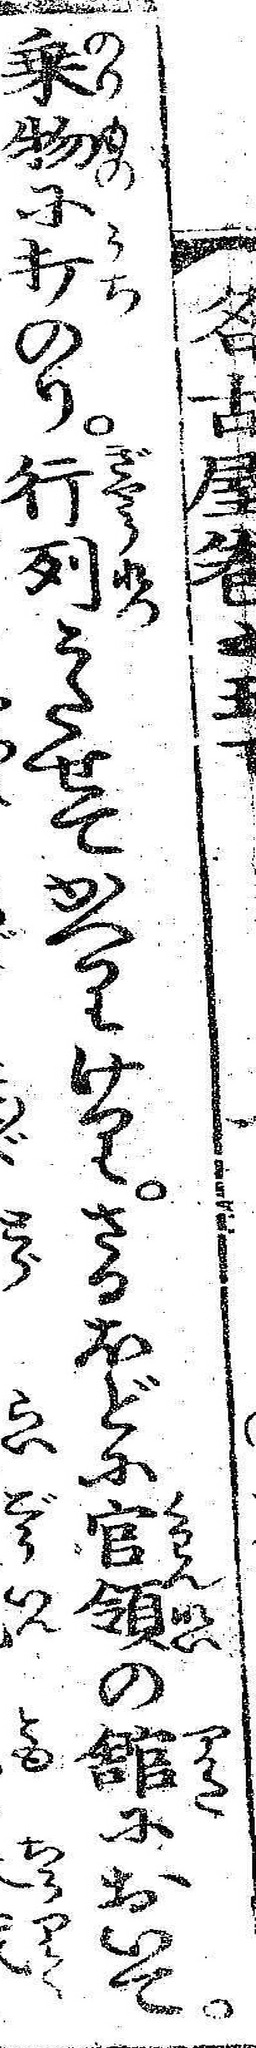乗物に打のり。行列うたせてかへりけり。さるほどに官領の館において。
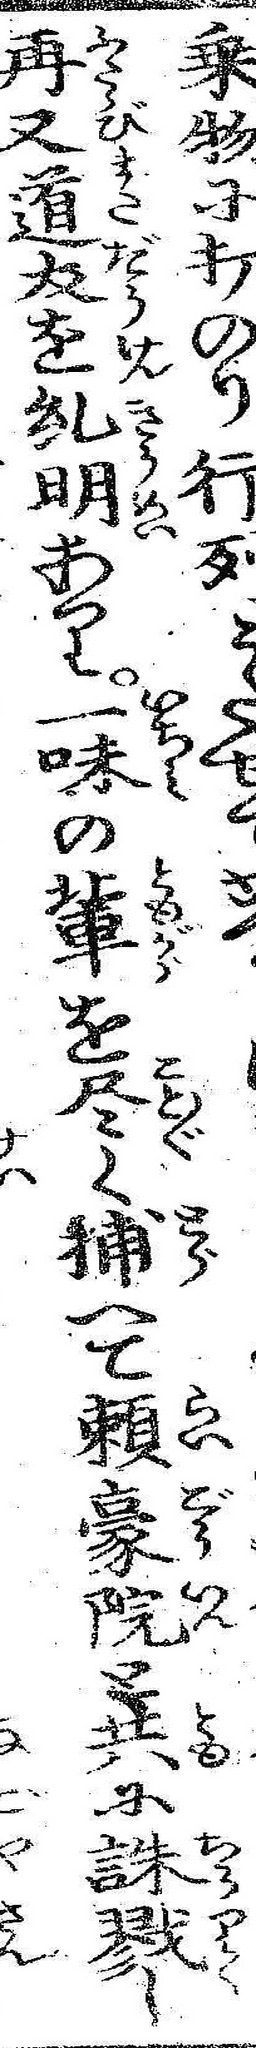再又道犬を糺明あり。一味の輩を尽く捕へて頼豪院と共に誅戮し
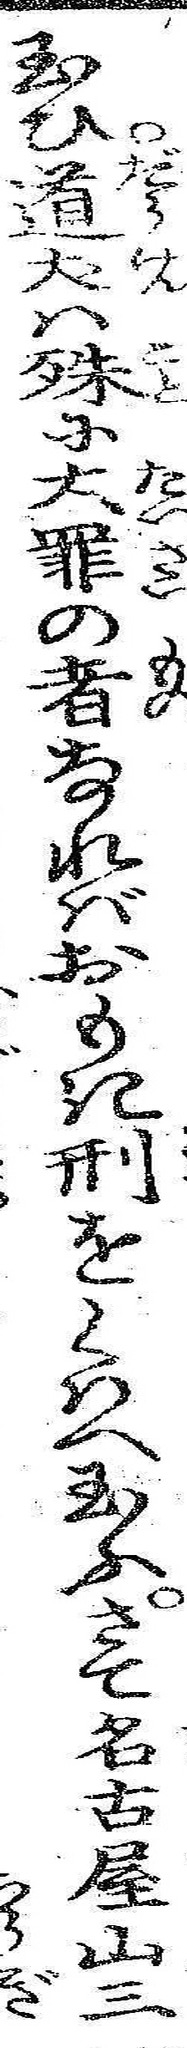玉ひ。道犬は殊に大罪の者なればおもき刑をくはへ玉ふ。さて名古屋山三
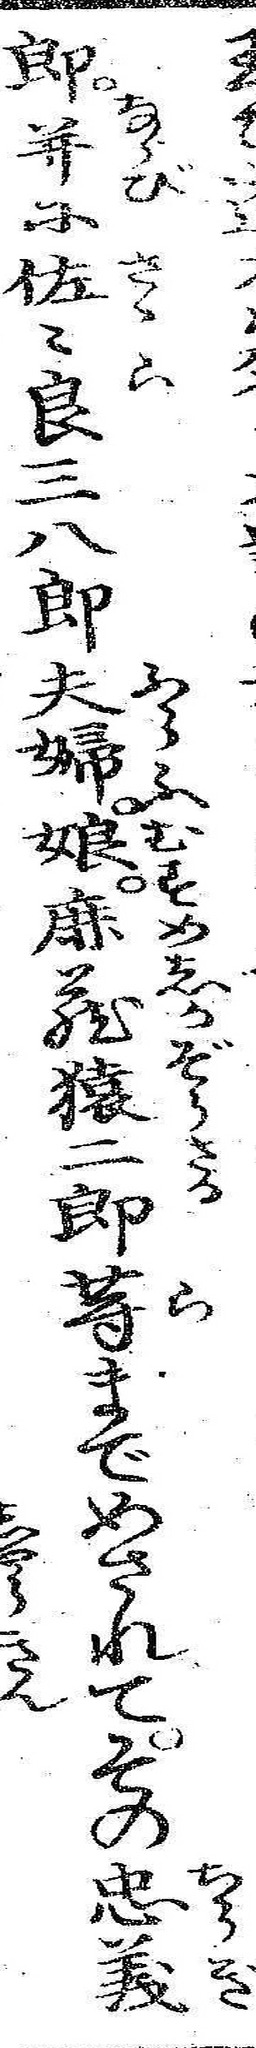郎。並に佐々良三八郎夫婦。娘。鹿蔵猿二郎等までめされて。その忠義
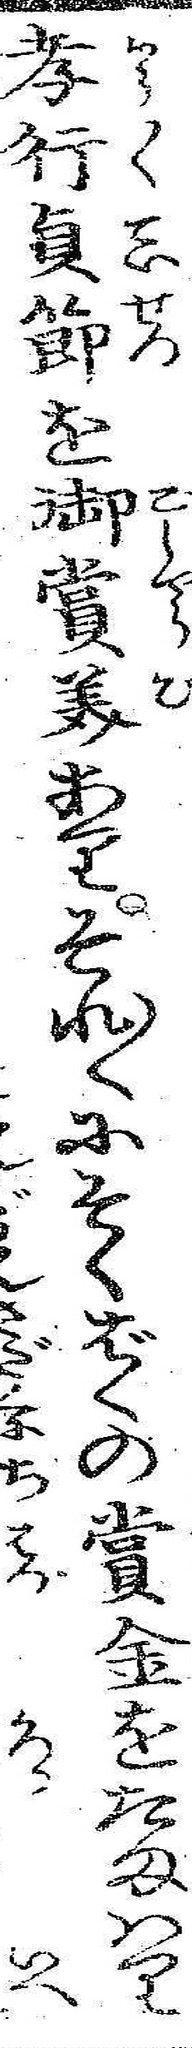孝行貞節を御賞美あり。それ〳〵にそくばくの賞金をたまはり
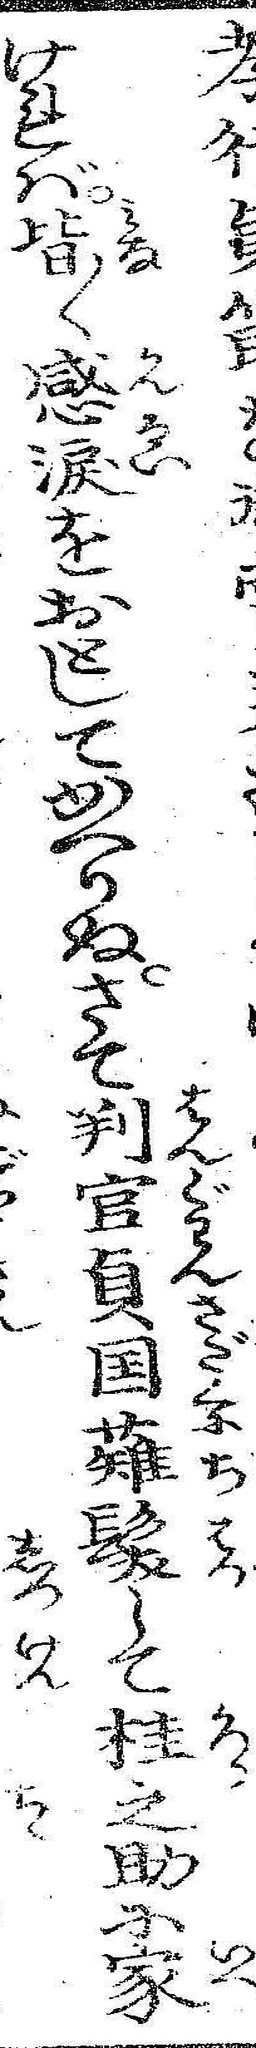ければ。皆感涙をおとしてかへりぬ。さて判官貞国薙髪して桂之助に家
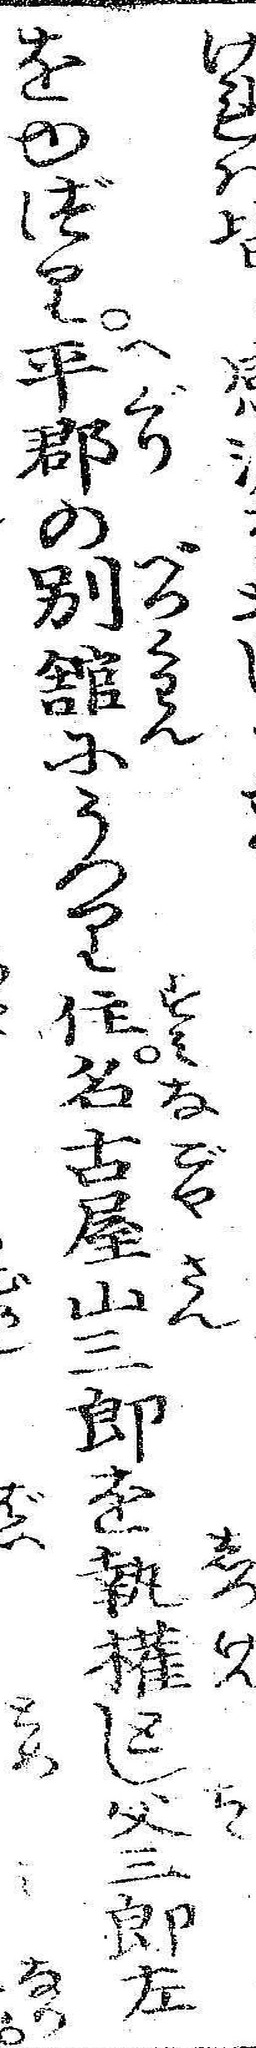をゆづり。平郡の別館にうつり住。名古屋山三郎を執権とし父三郎左
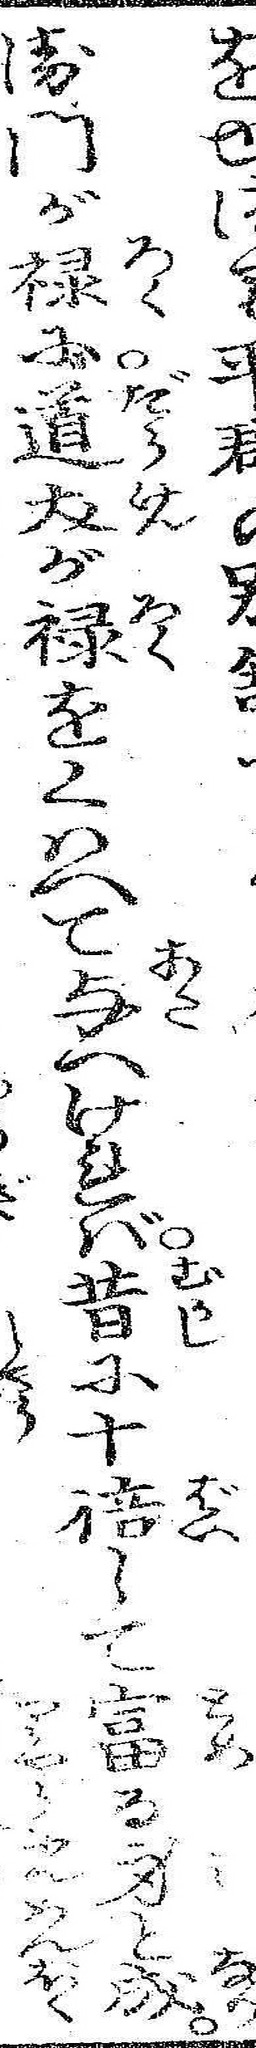衛門が禄に。道犬が禄をくはへて与へければ。昔に十倍して富る身と成。
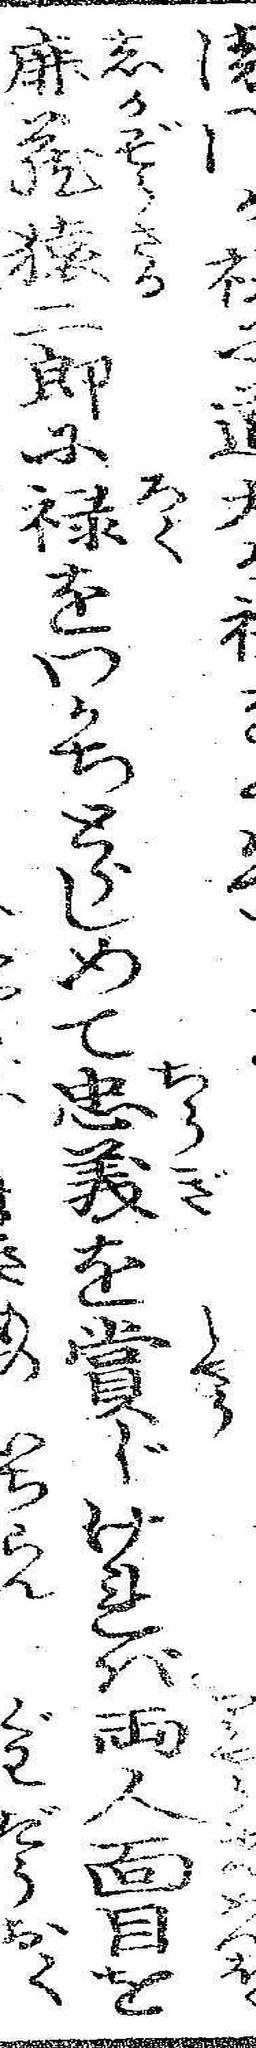鹿蔵猿二郎に禄をわかちとらしめて忠義を賞じければ。両人面目を
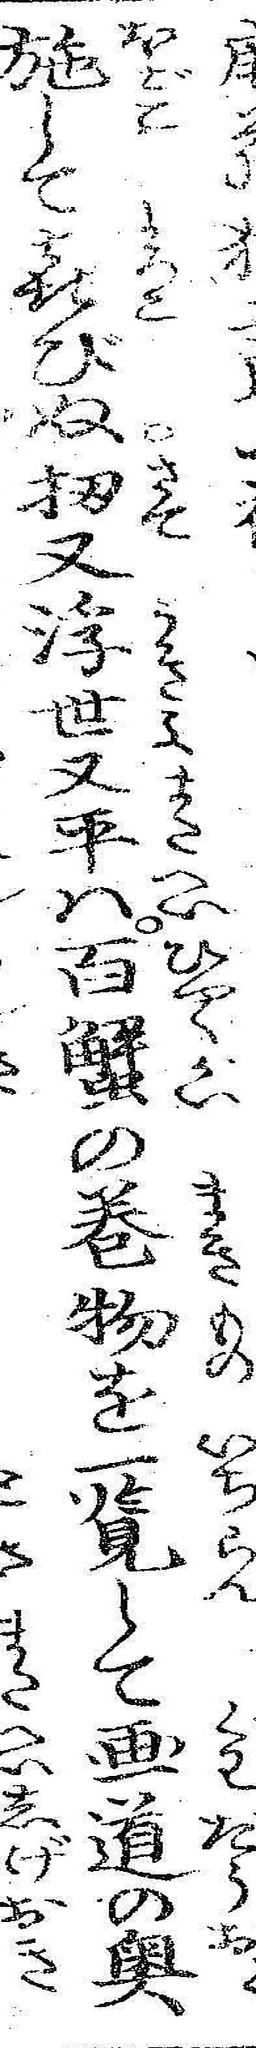施して㐂びぬ。扨又浮世又平は。百蟹の巻物を一覧して画道の奥
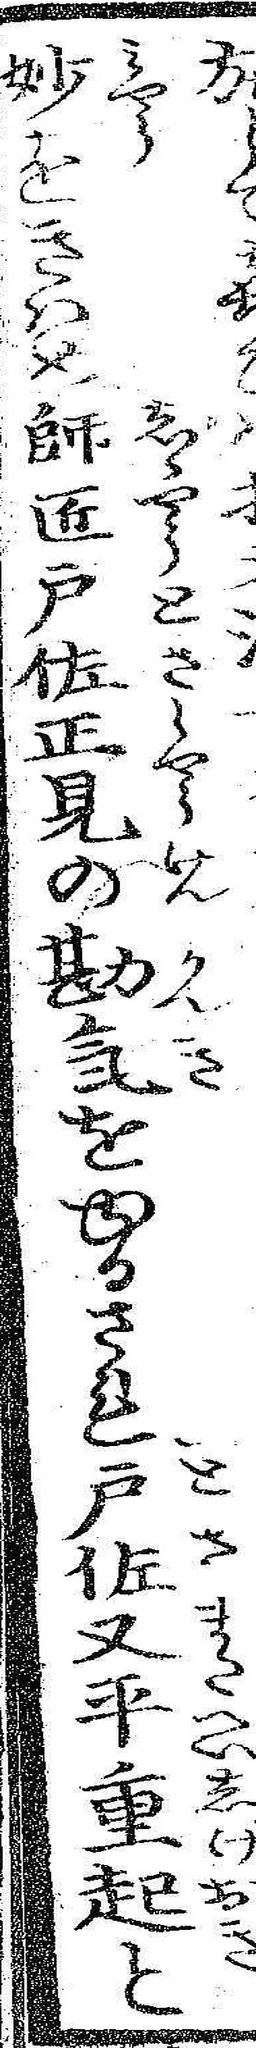妙をきはめ。師匠戸佐正見の勘気をゆるされ。戸佐又平重起と
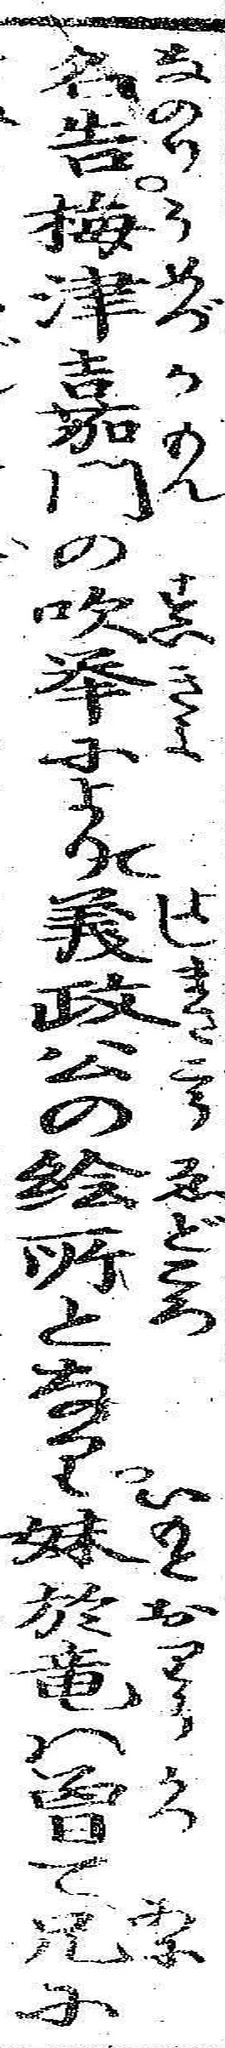名告。梅津嘉門の吹挙によりて義政公の絵所となり。妹於竜は曽て兄に
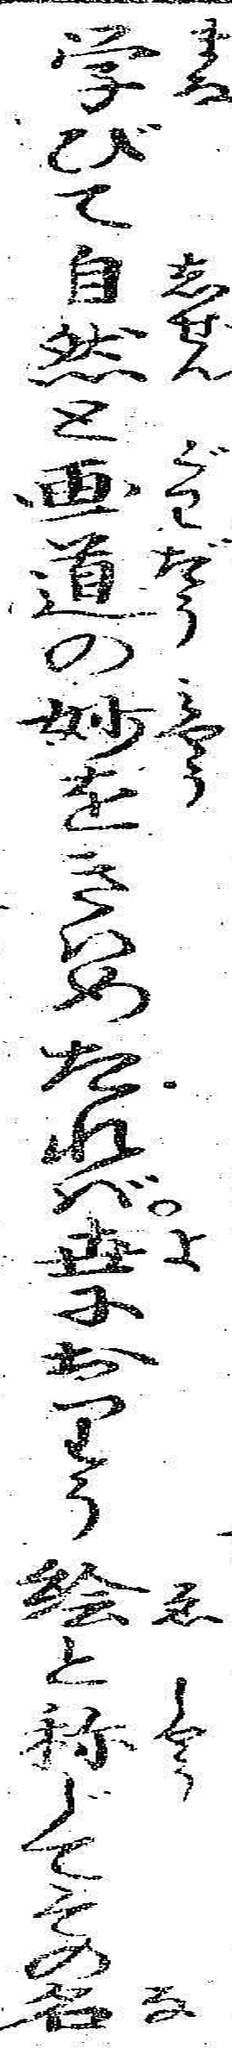学びて自然と画道の妙をきはめたれば。世におりう絵と称じてその名
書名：昔話稲妻表紙
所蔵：国文学研究資料館
